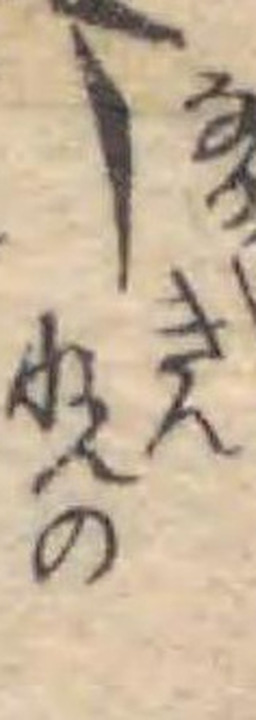ねんの
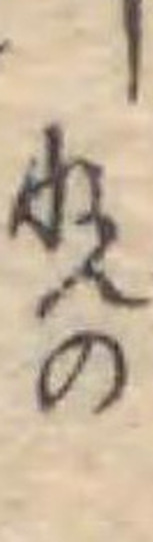ねんの
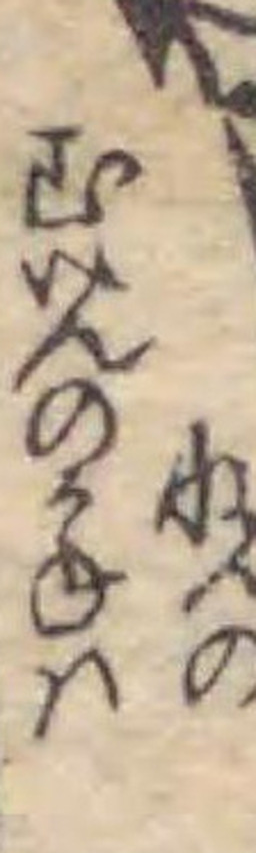むけんのかねは
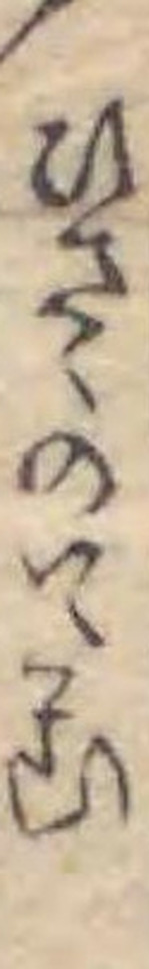ひさくのいたむ
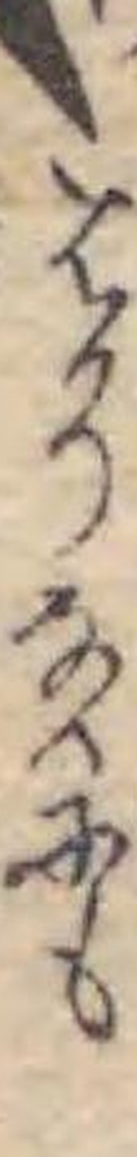はかりなんにも
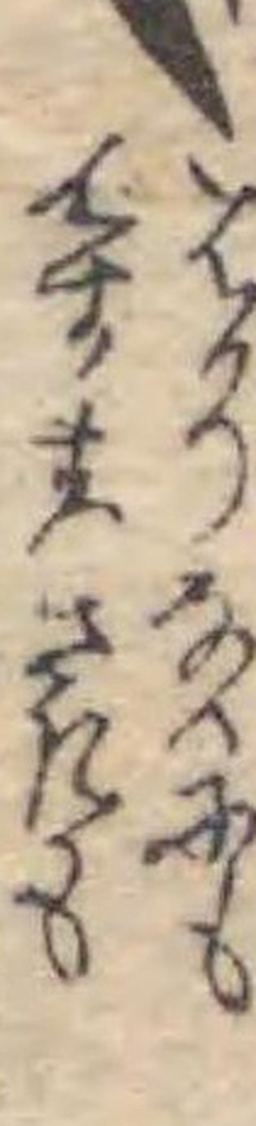ですまつさきも
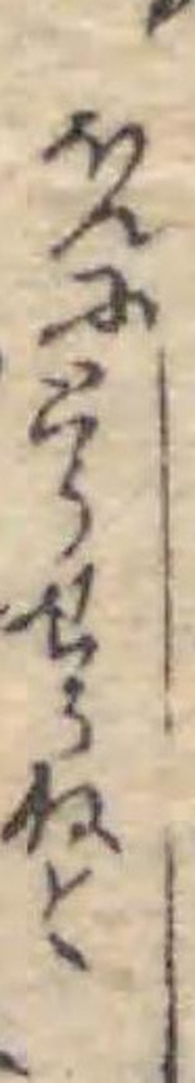ほんにとうせうねと
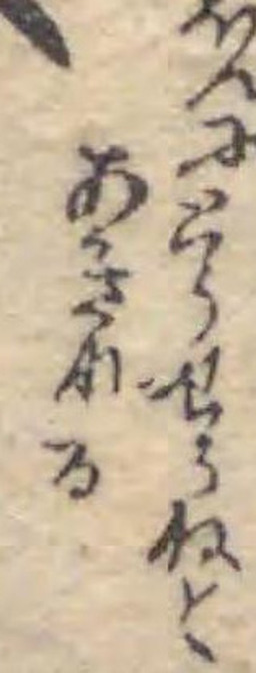あきれる
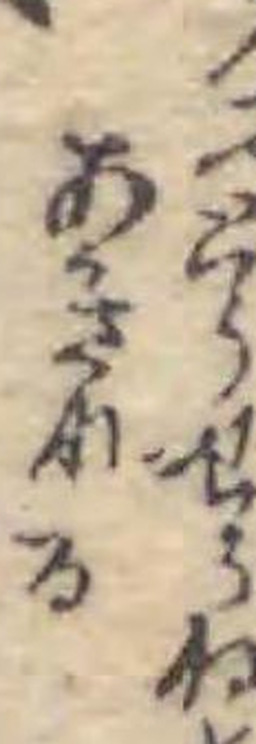あきれる
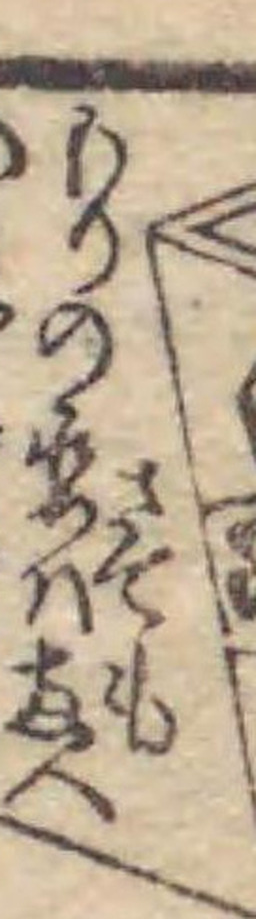もりの丞は両人
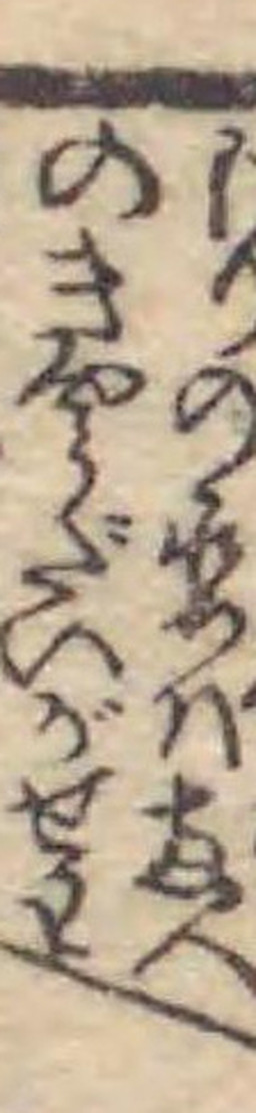のきやうだちがせわ
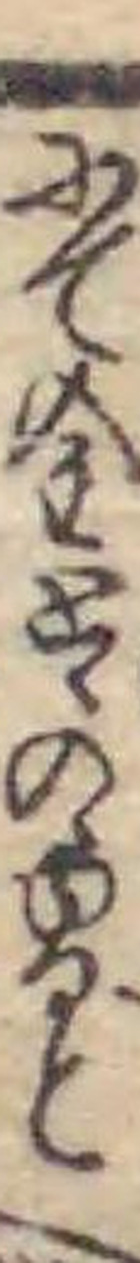にて金とゝのゆると
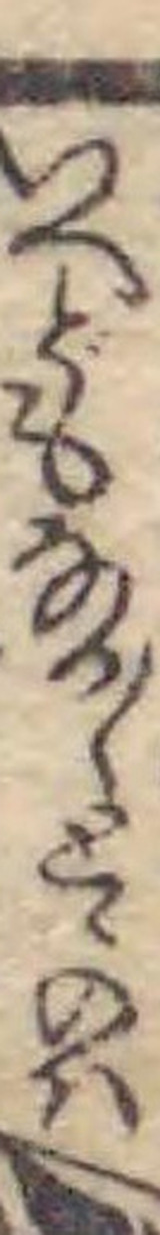いへともなか〳〵とゝのは
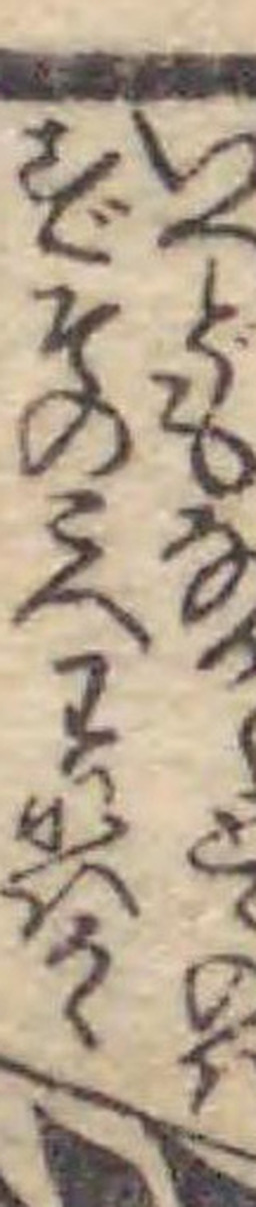ずその二人われはかく
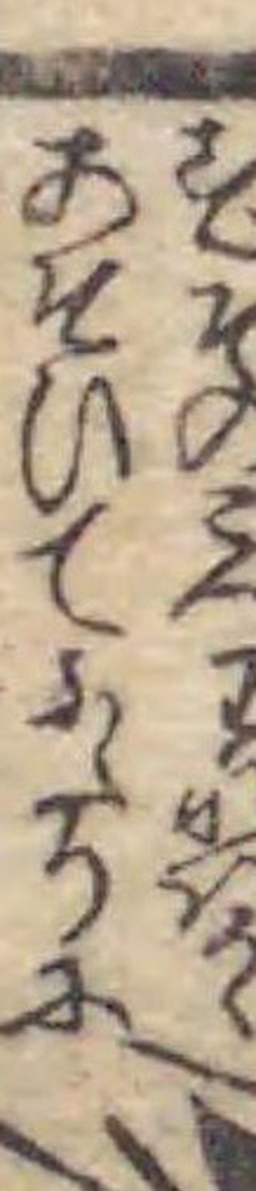あそひてふたりに
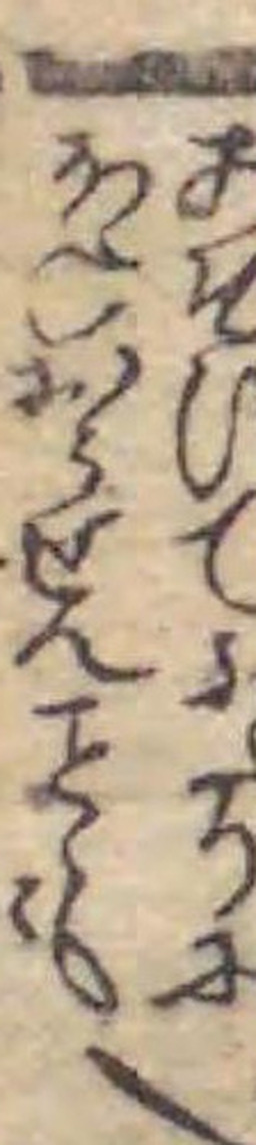ほねおらせんことも
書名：扨化狐通人 : 2巻
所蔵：国立国会図書館 National Diet Library, JAPAN
